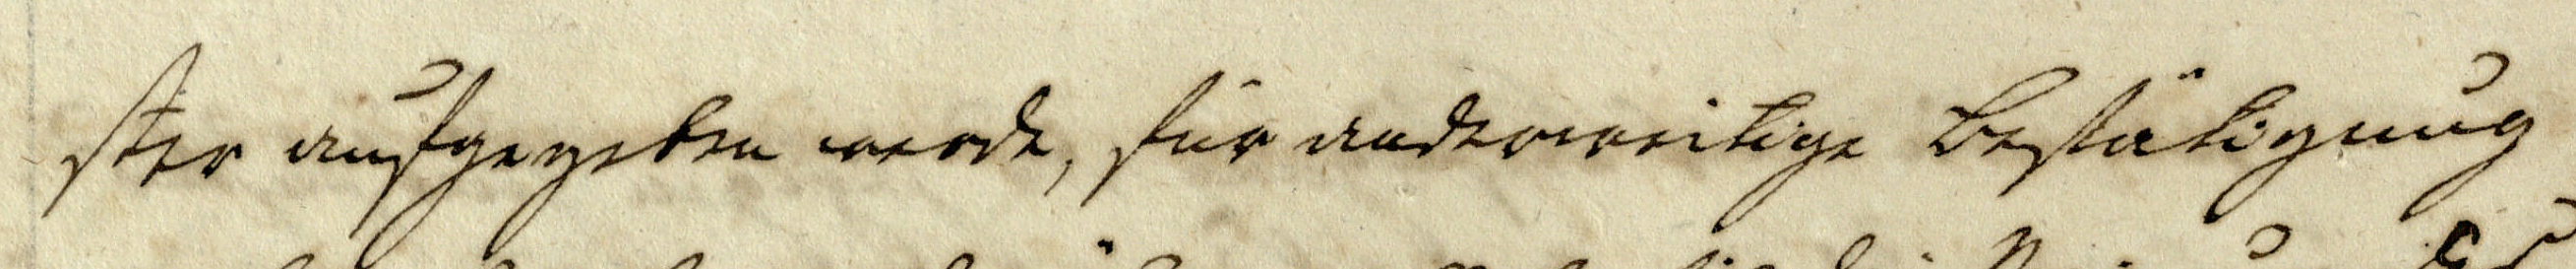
ster aufgegeben werde, für anderweitige Bestätigung
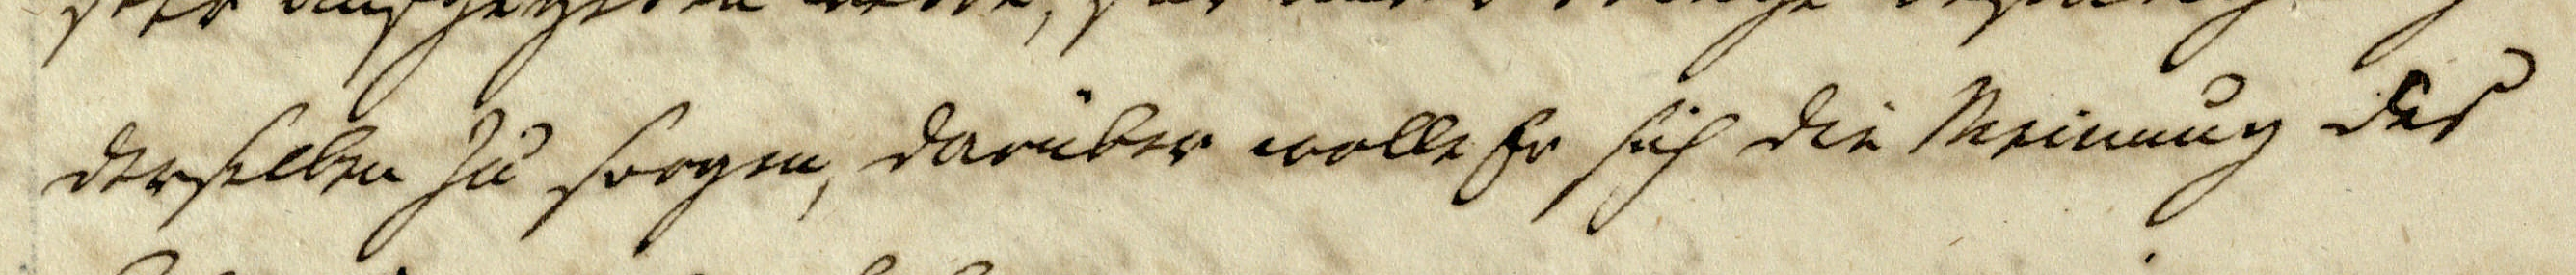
derselben zu sorgen, darüber wolle Er sich die Meinung des
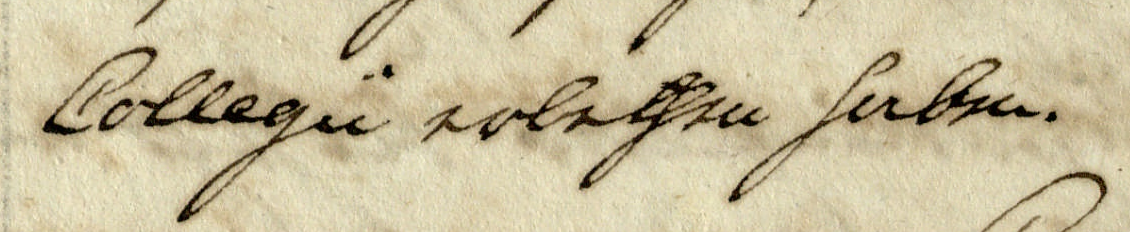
Collegii erbethen haben.
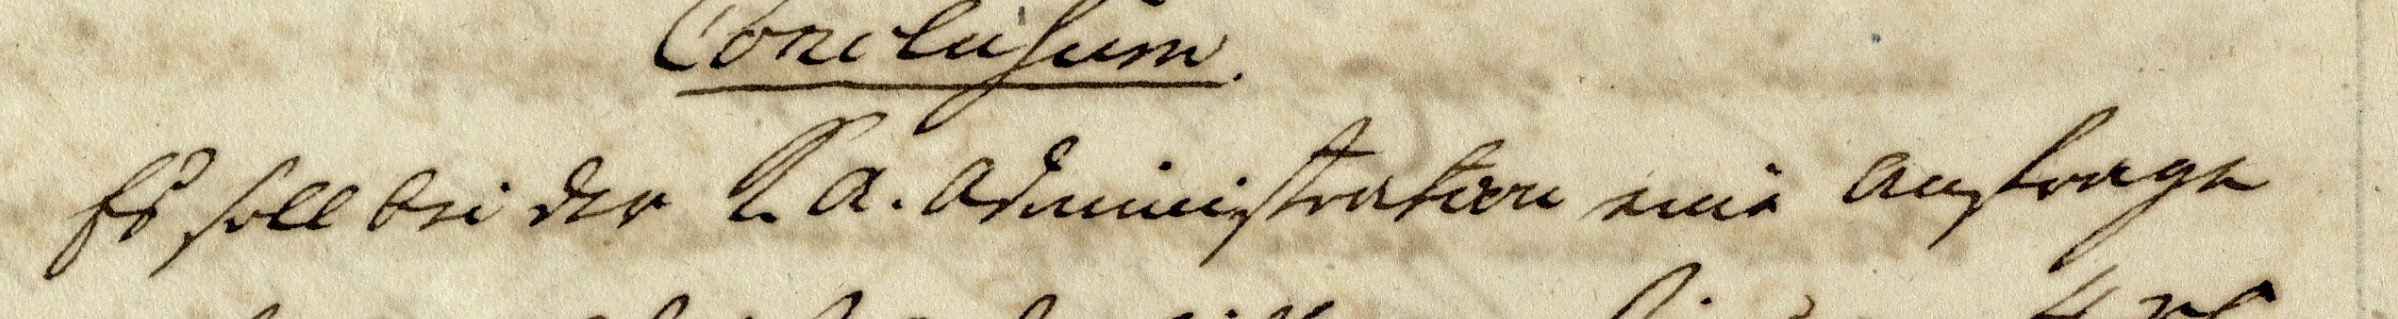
Es soll bei der K. A. Administration eine Anfrage
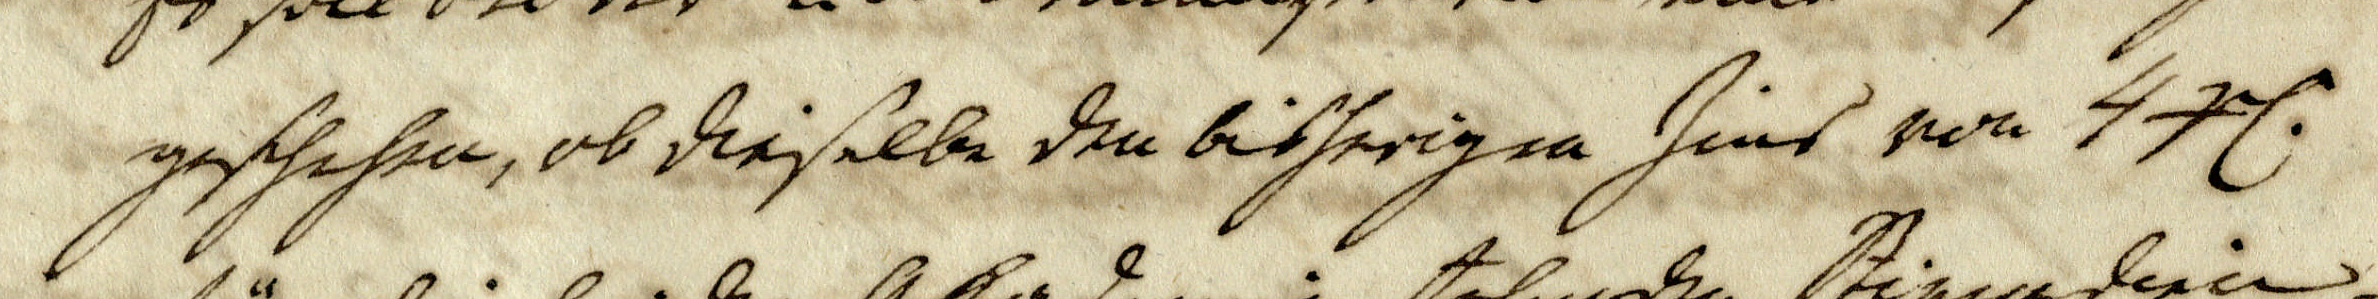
geschehen, ob dieselbe den bisherigen Zins von 4 pl.
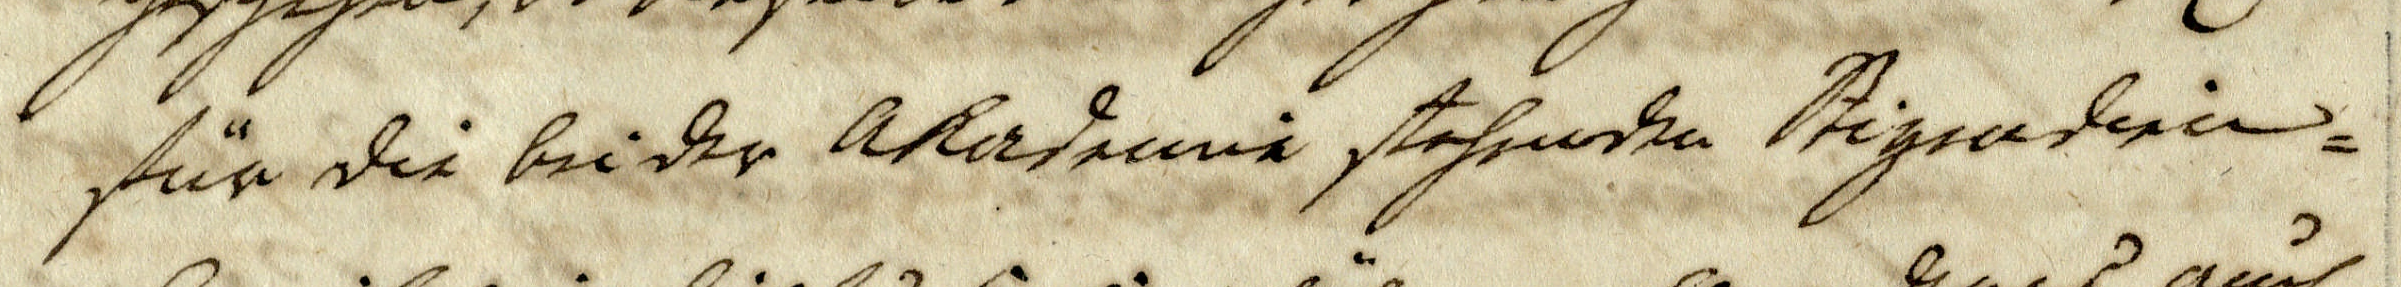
für die bei der Akademie stehenden Stipendien-
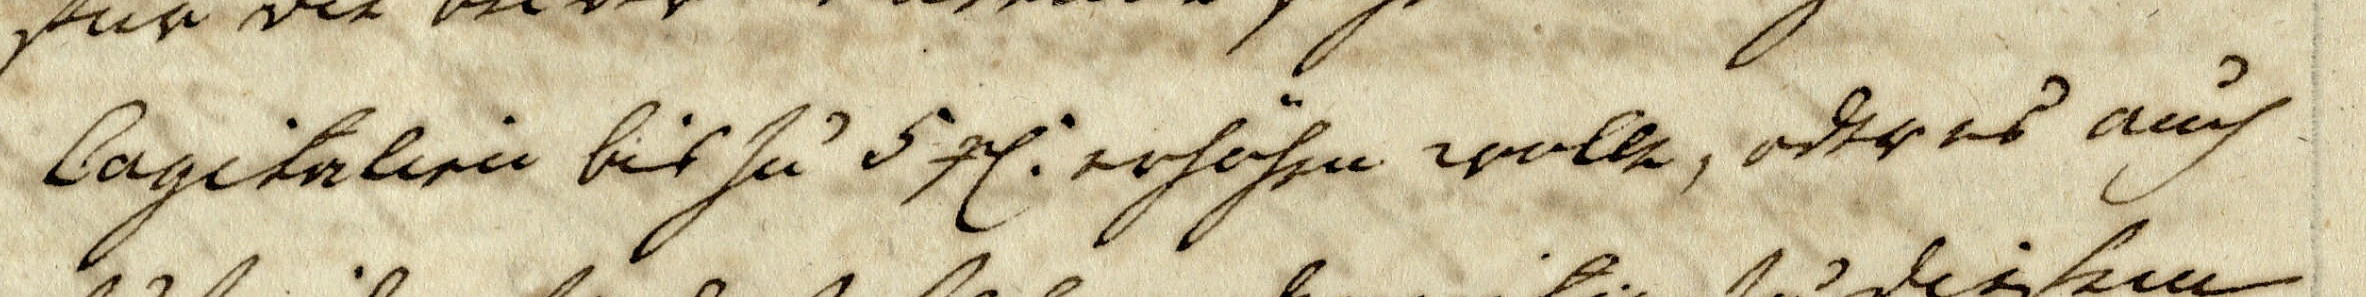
Capitalien bis zu 5 pl. erhöhen wolle, oder es auch
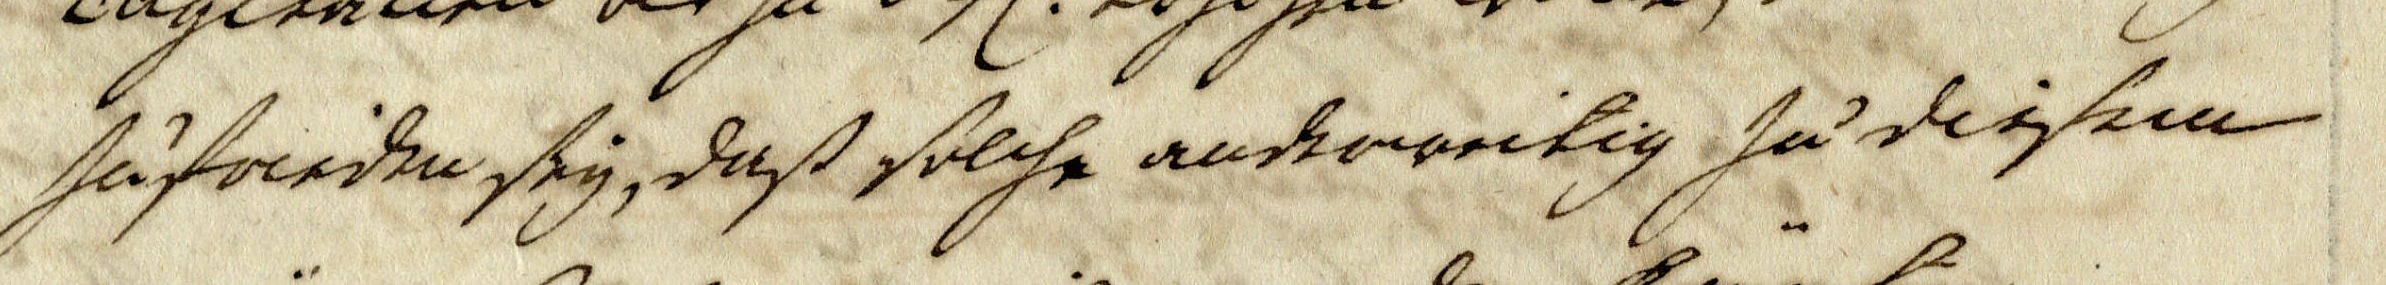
zufrieden seÿ; daß solche anderweitig zu diesem
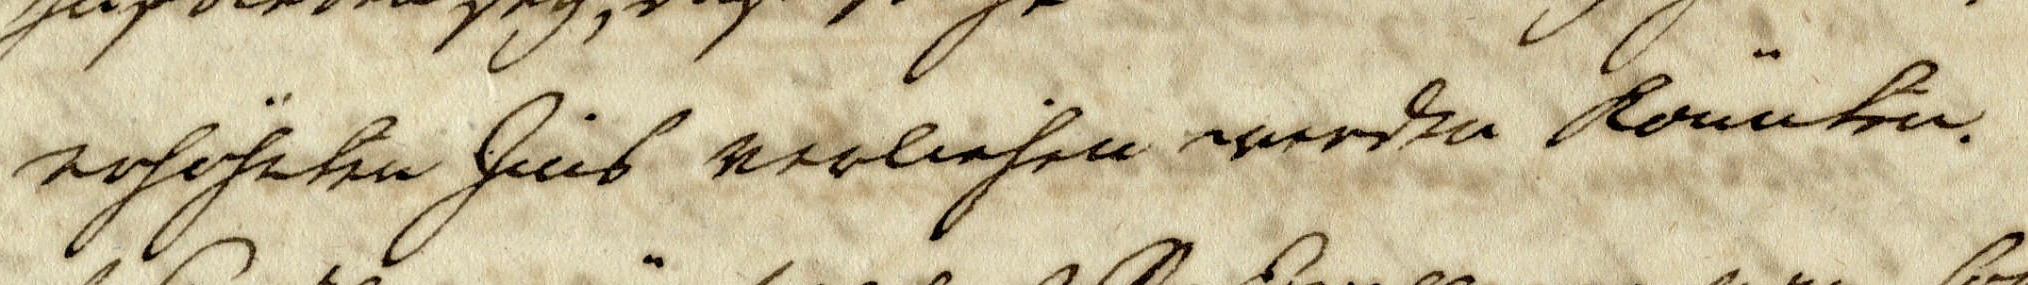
erhöheten Zins verliehen werden könnten.
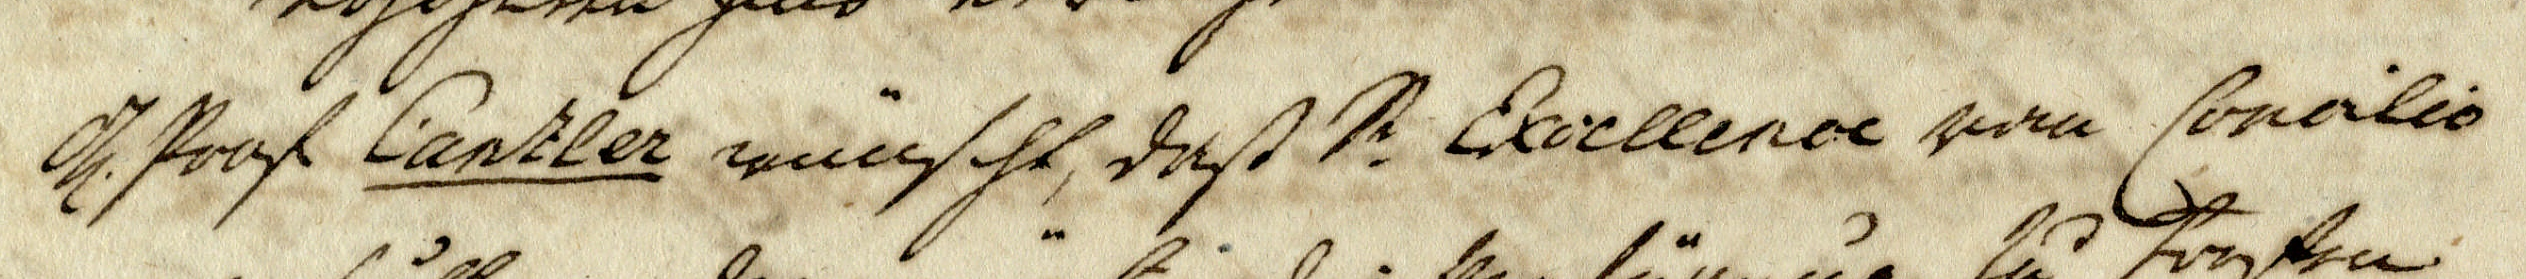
dh. Prof. Canzler wünscht, daß Sr. Excellence vom Concilio
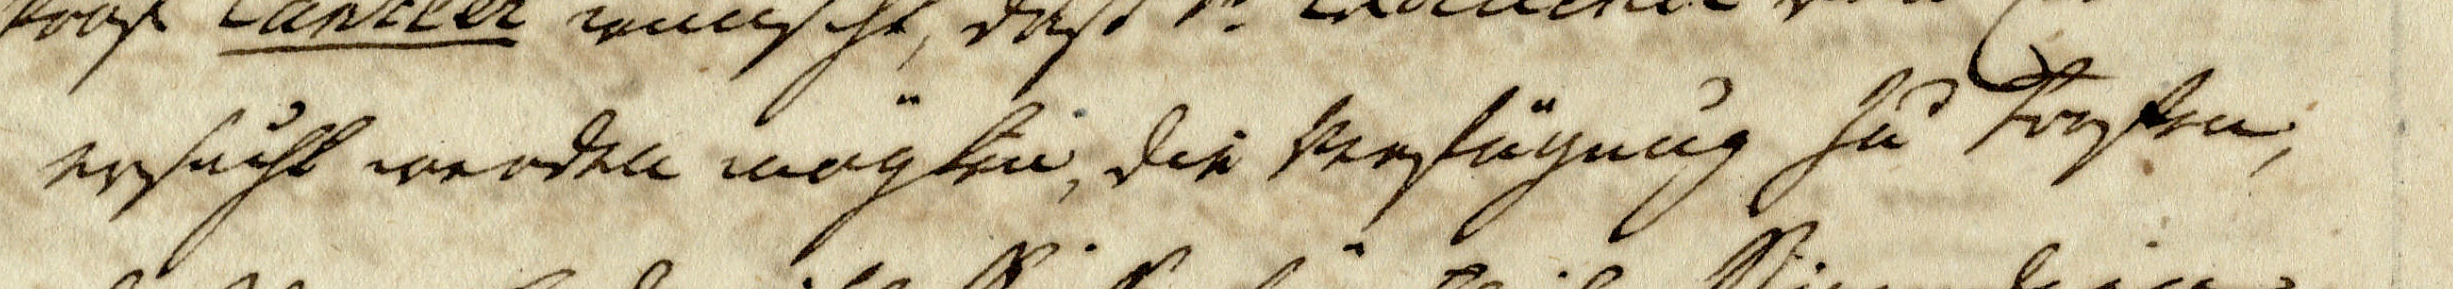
ersucht werden mögten, die Verfügung zu treffen,
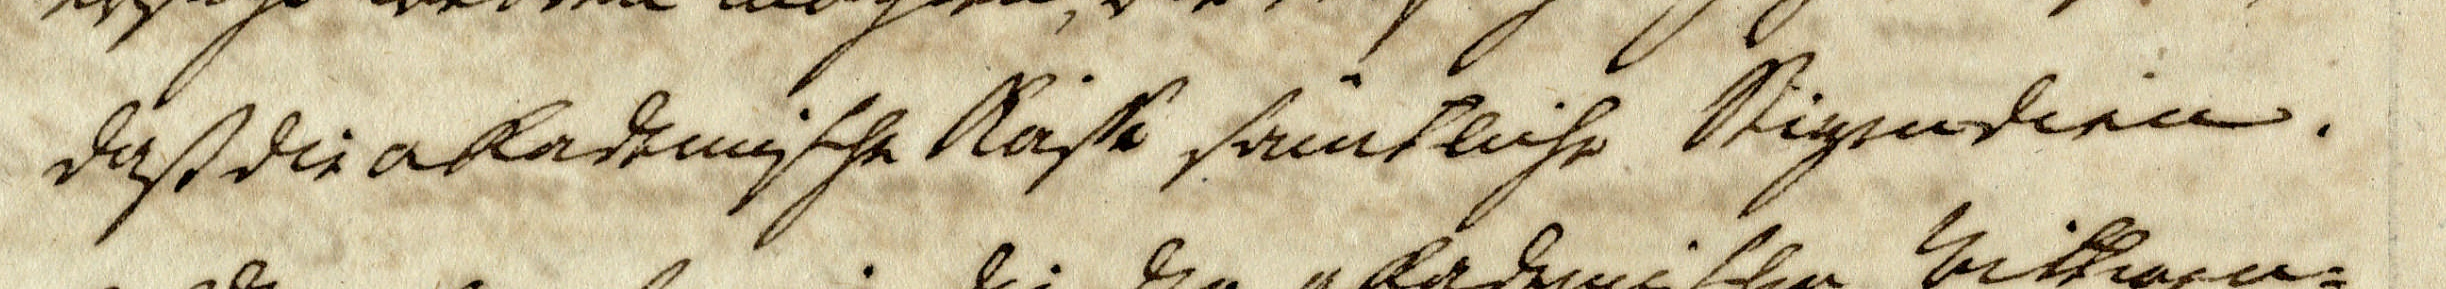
daß die akademische Kasse sämtliche Stipendien¬
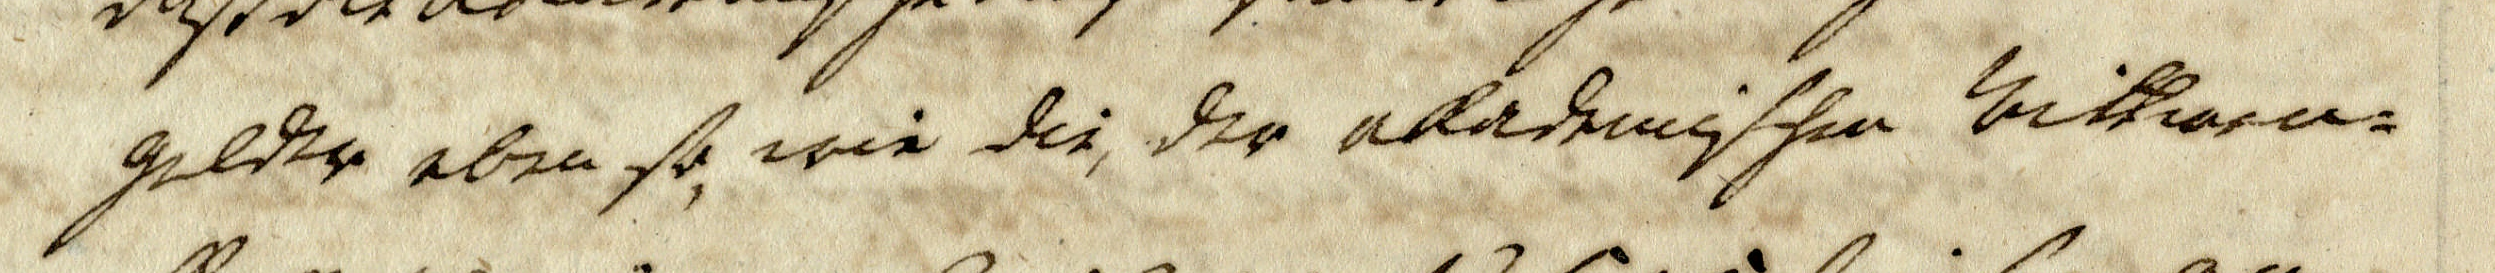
gelder ebenso, wie die, der akademischen Wittwen-
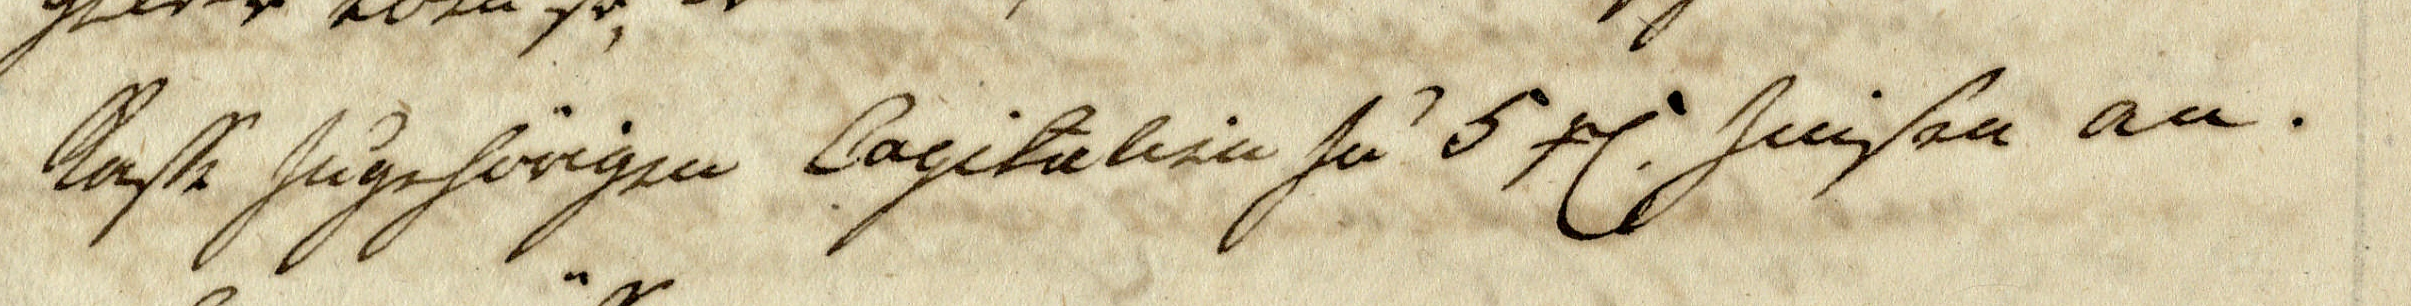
Kasse zugehörigen Capitalien zu 5 rl. Zinsen an¬
